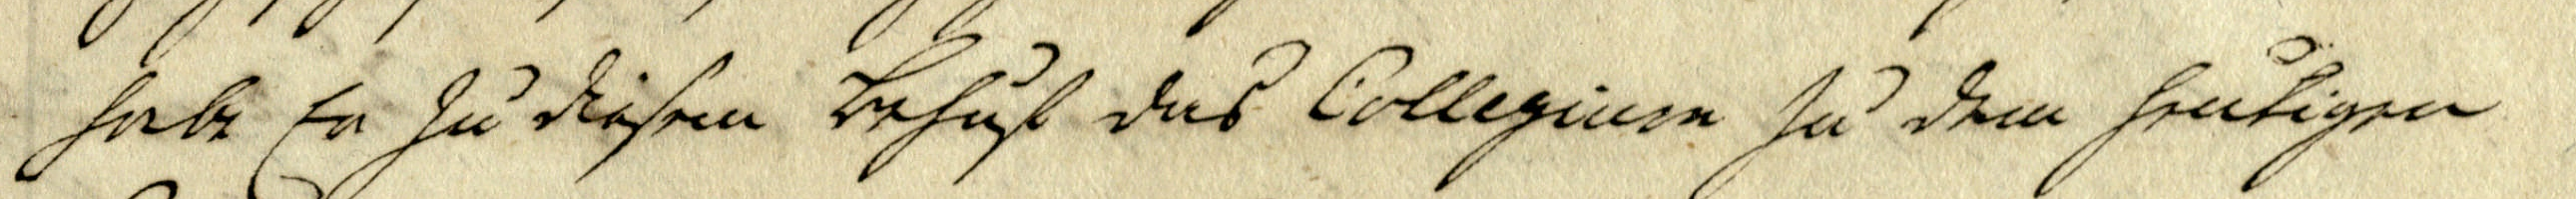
habe Er zu diesem Behuf das Collegium zu dem heutigen
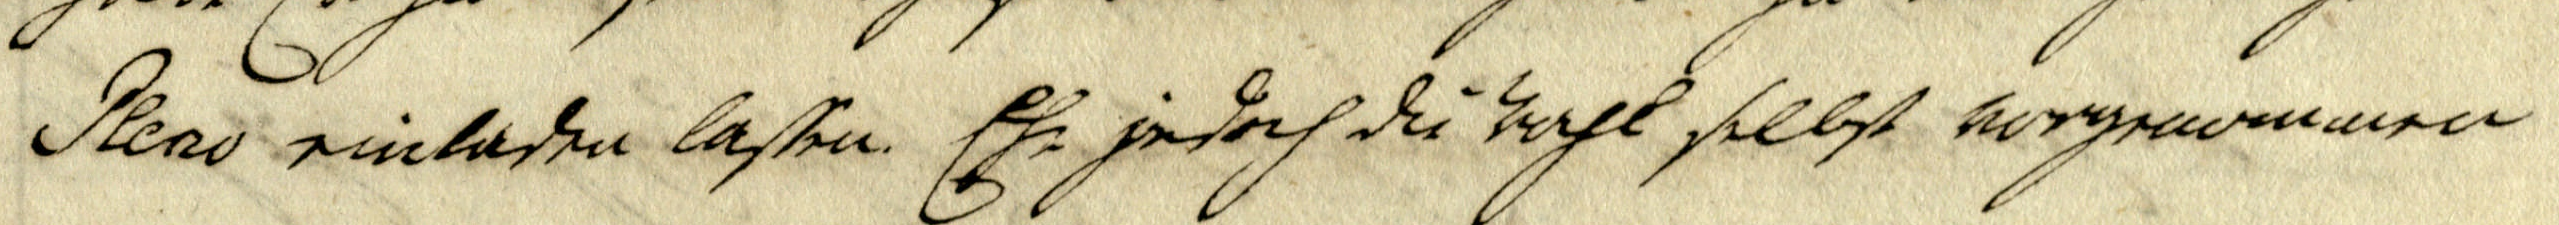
Pleno einladen lassen. Ehe jedoch die Wahl selbst vorgenommen
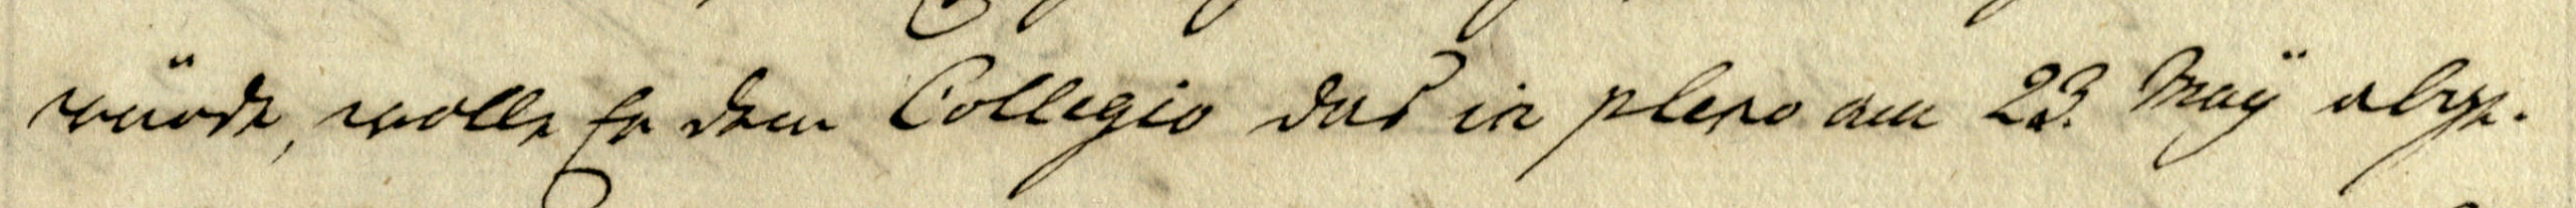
würde, wolle Er dem Collegio das in pleno am 23. Maÿ abge¬
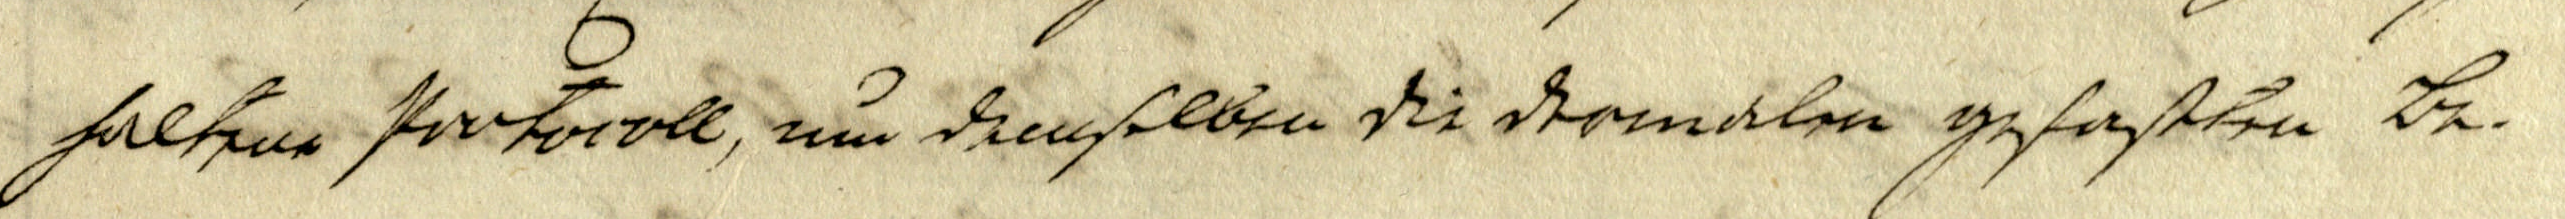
haltene Protocoll, um demselben die dermalen gefaßten Be¬
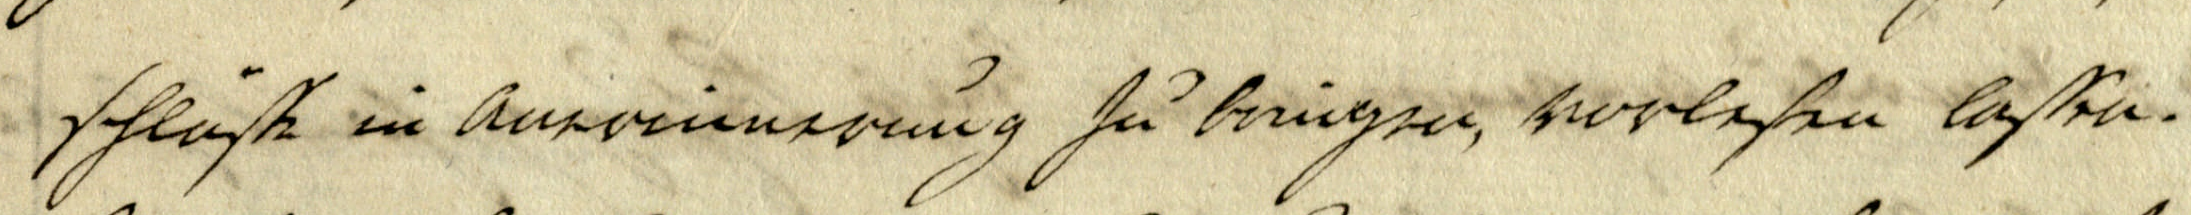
schlüsse in Anerinnerung zu bringen, vorlesen lassen.
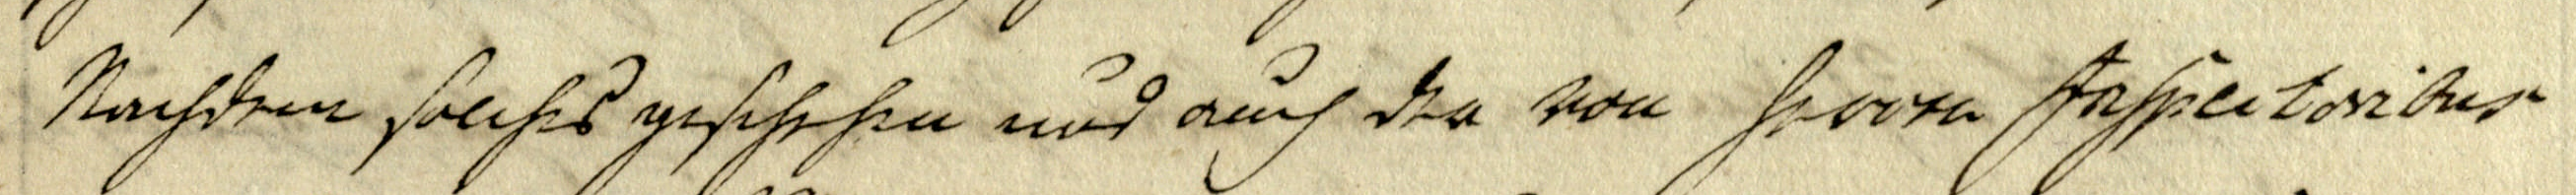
Nachdem solches geschehen und auch der von herren Inspectoribus
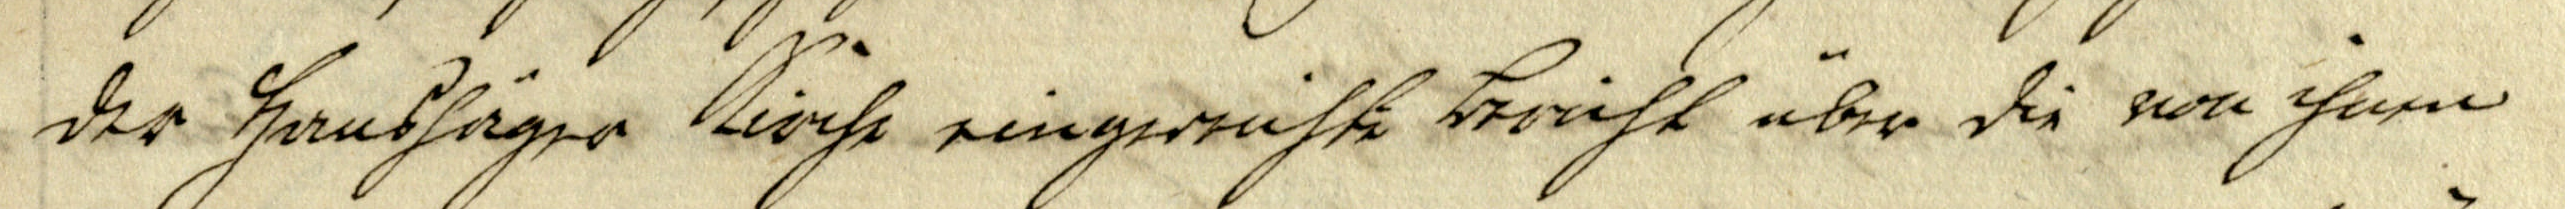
der Hanshäger Kirche eingereichte Bericht über die von ihnen
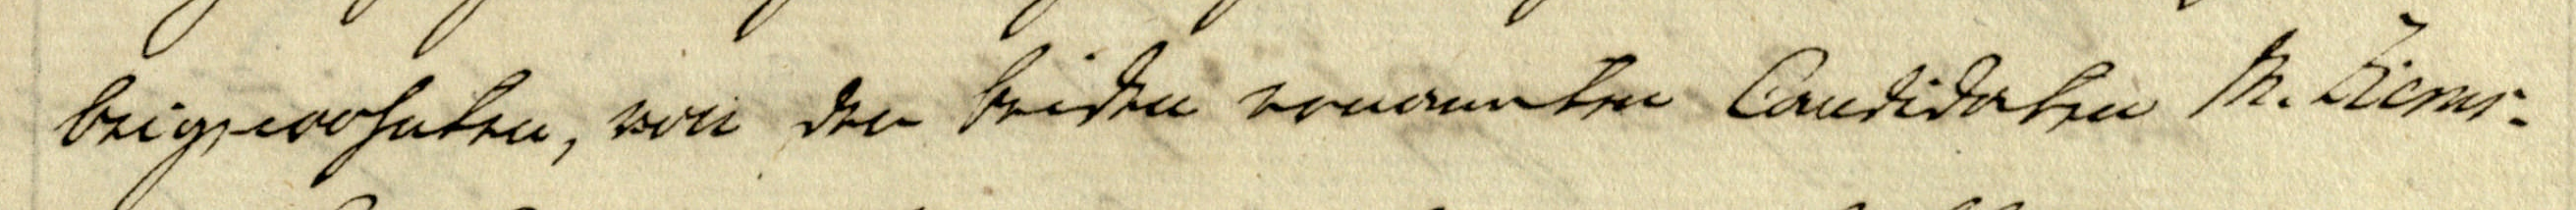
beigewohnten, von den beiden ernannten Candidaten M. Ziems¬
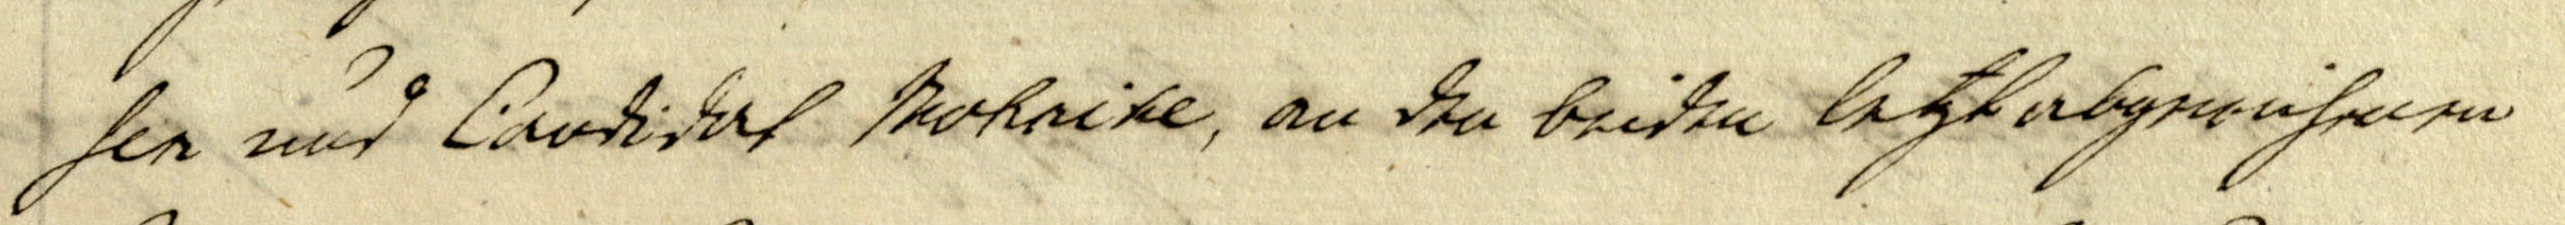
sen und Candidat Mohnike, an den beiden letzt abgewichenen
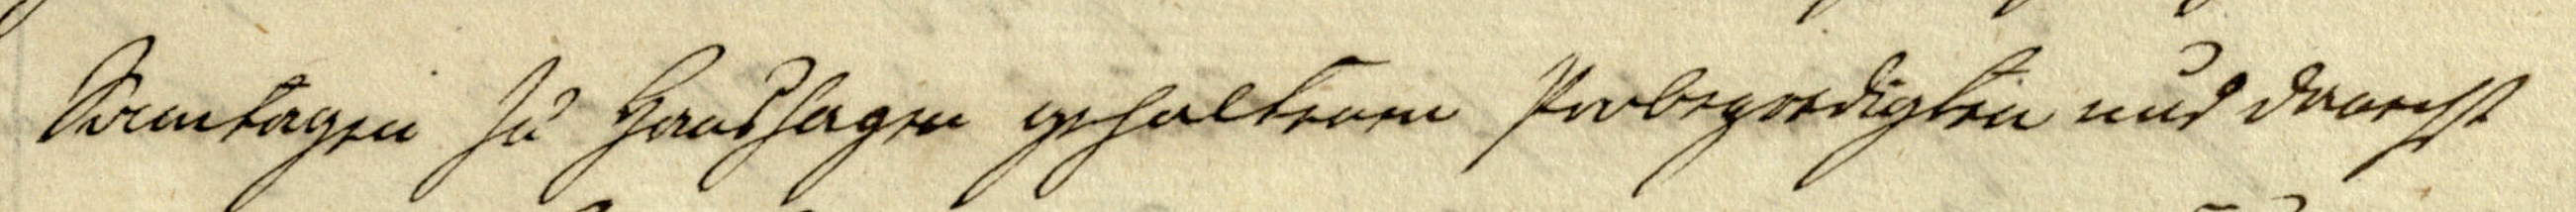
Sonntagen zu Hanshagen gehaltenen Probepredigten und danechst
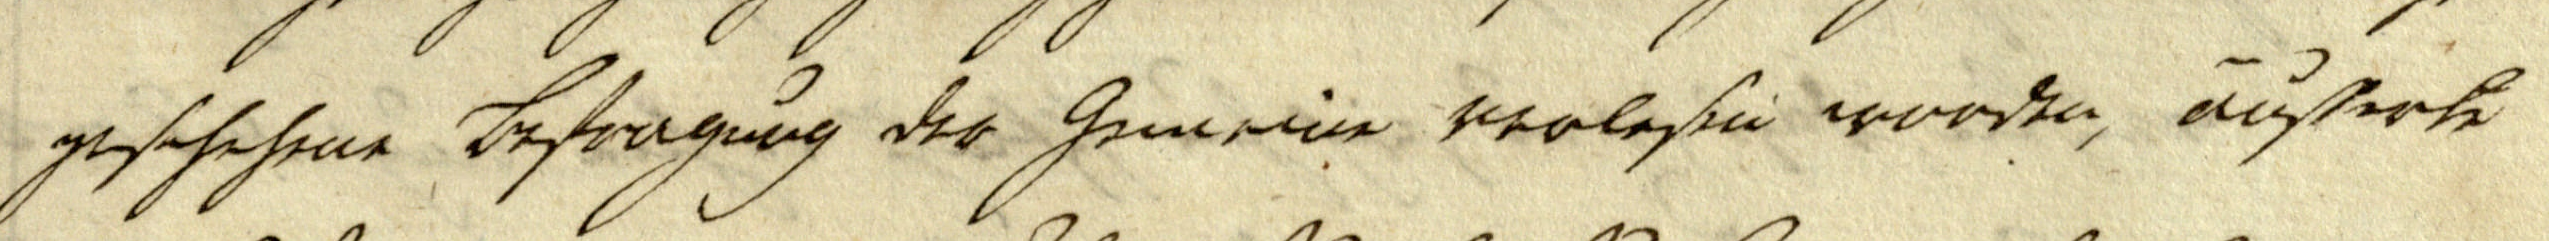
geschehene Befragung der Gemeine verlesen worden, äusserte
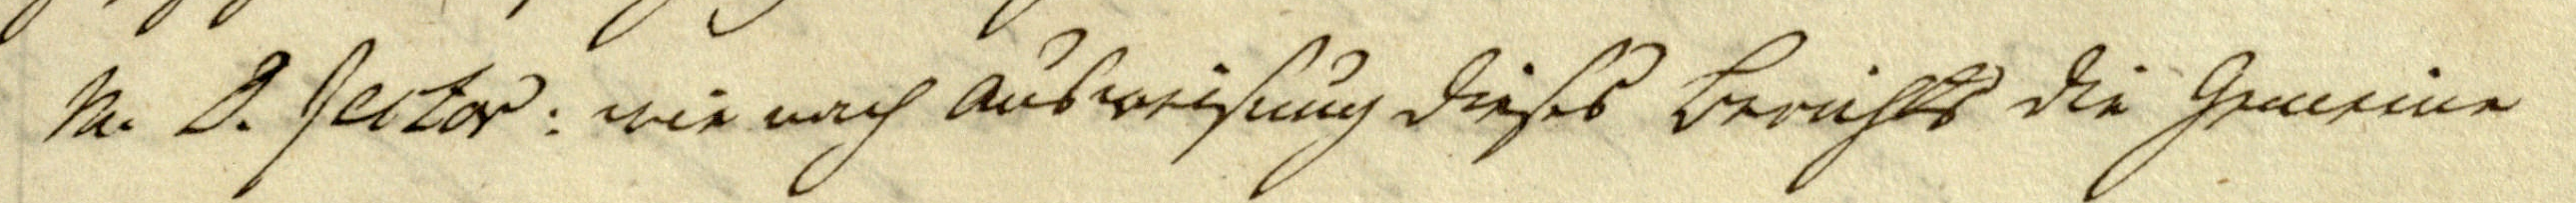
M. D. Rector: wie nach Ausweisung dieses Berichts die Gemeine
